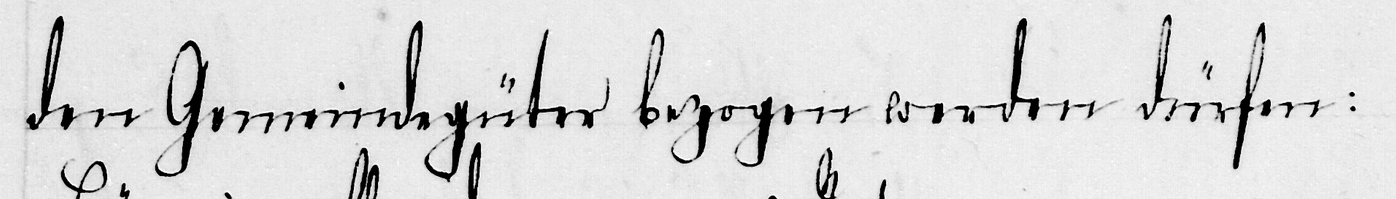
den Gemeindegüter bezogen werden dürfen:
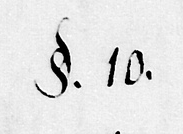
§. 10.
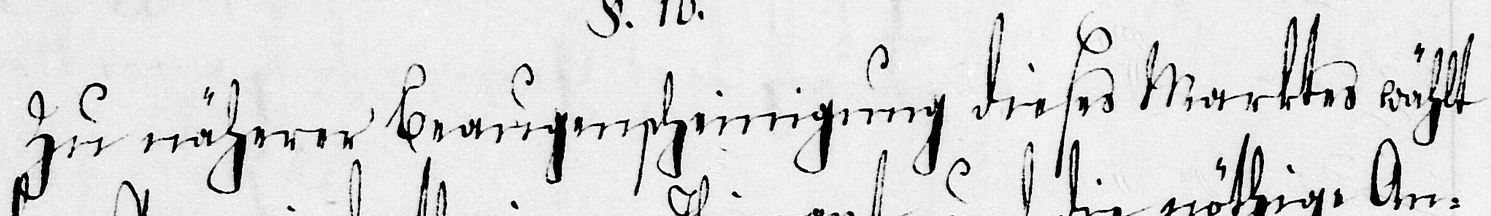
Zu näherer Beaugenscheinigung dieses Marktes wählt
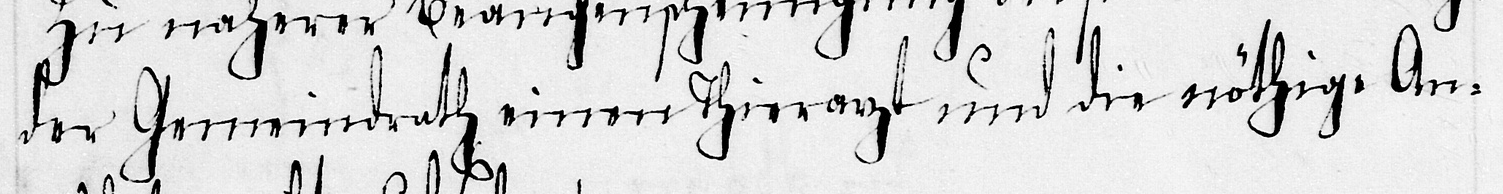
der Gemeindrath einen Thierarzt und die nöthige An¬
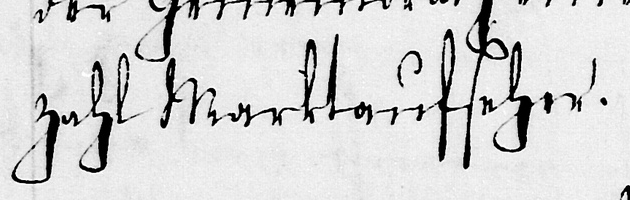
zahl Marktaufseher.
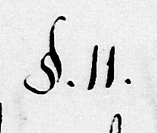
§. 11.
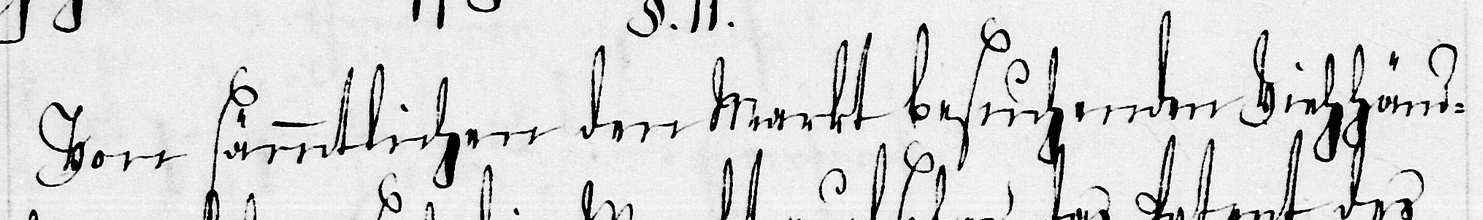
Von sämmtlichen den Markt besuchenden Viehhänd¬
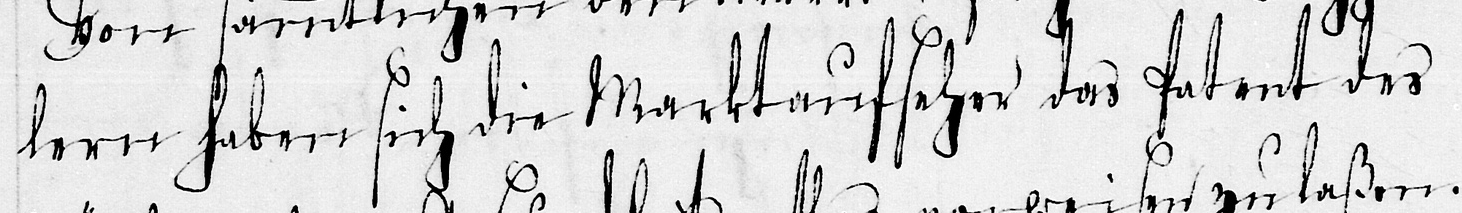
lern haben sich die Marktaufseher das Patent des
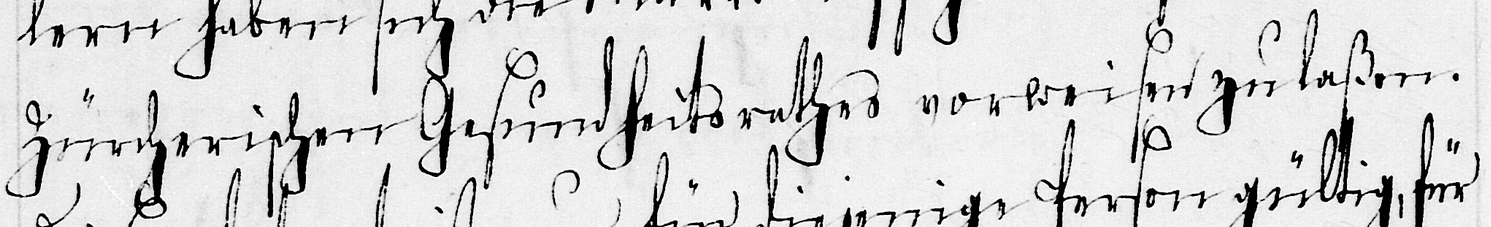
Zürcherischen Gesundheitsrathes vorweisen zu laßen.
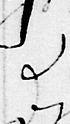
t.
